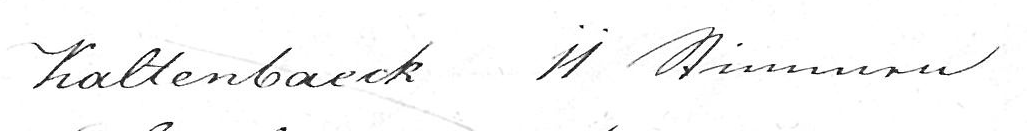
Kaltenbaeck 11 Stimmen
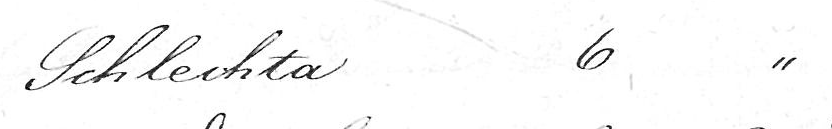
Schlechta 6 "
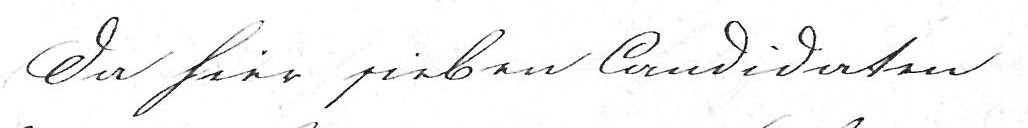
Da hier sieben Candidaten
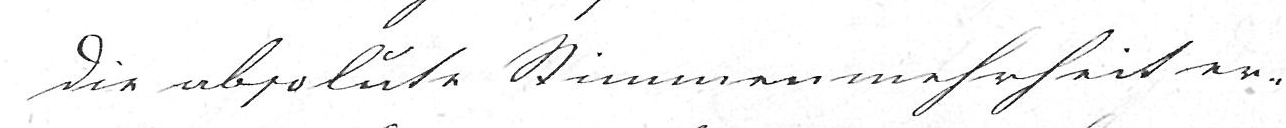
die absolute Stimmenmehrheit er-
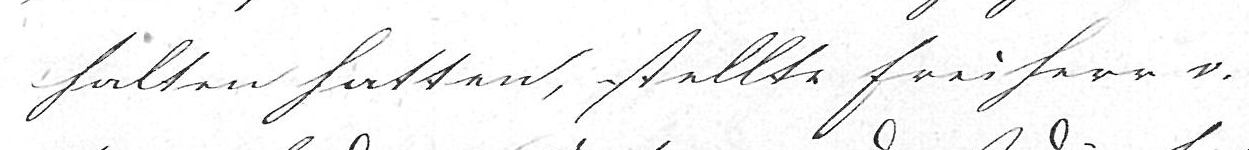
halten hatten, stellte Freiherr v.
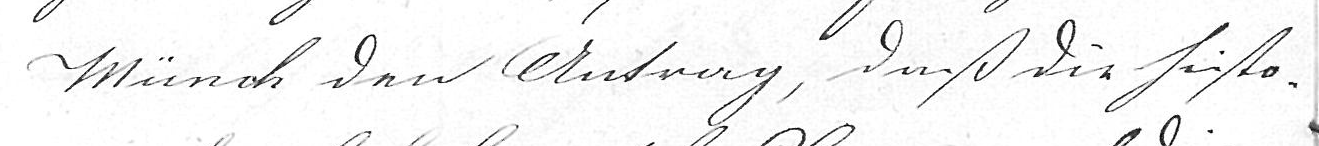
Münch den Antrag, daß die histo-
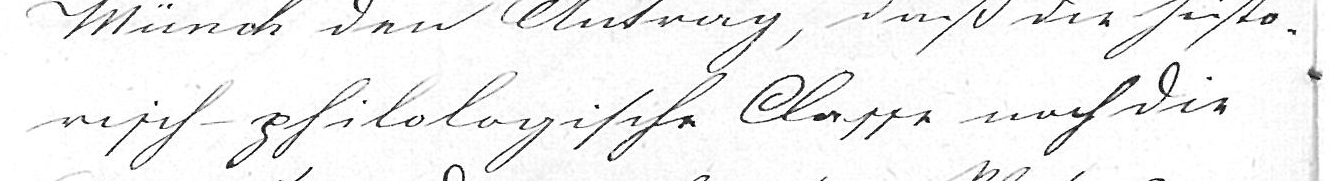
risch-philologische Classe noch die
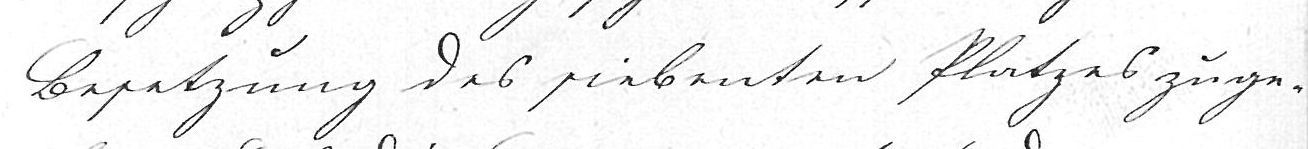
Benützung des siebenten Platzes zuge-
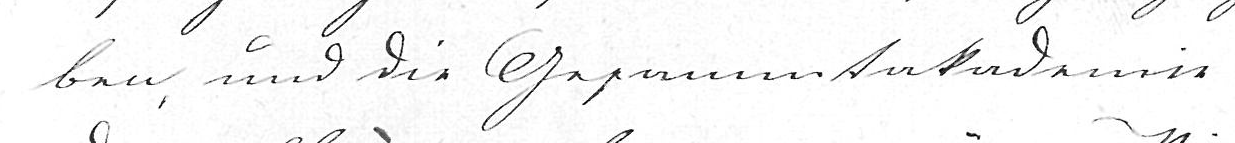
ben und die Gesamtakademie
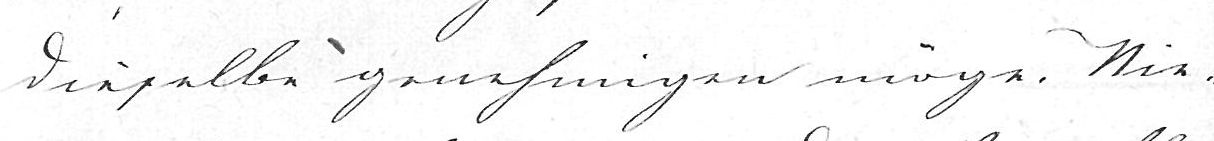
dieselbe genehmigen möge. Nie-
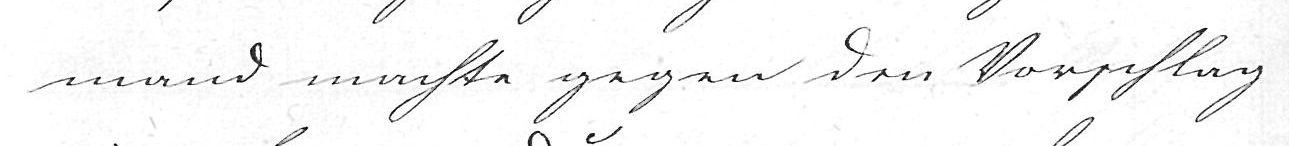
mans machte gegen den Vorschlag
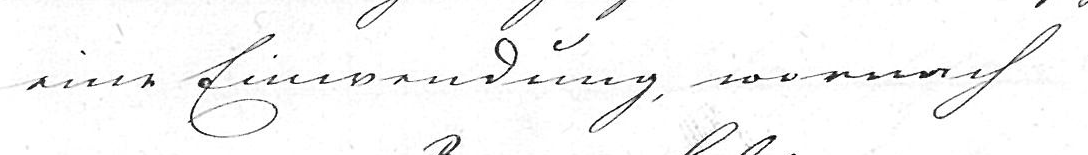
eine Einwendung, wornach
